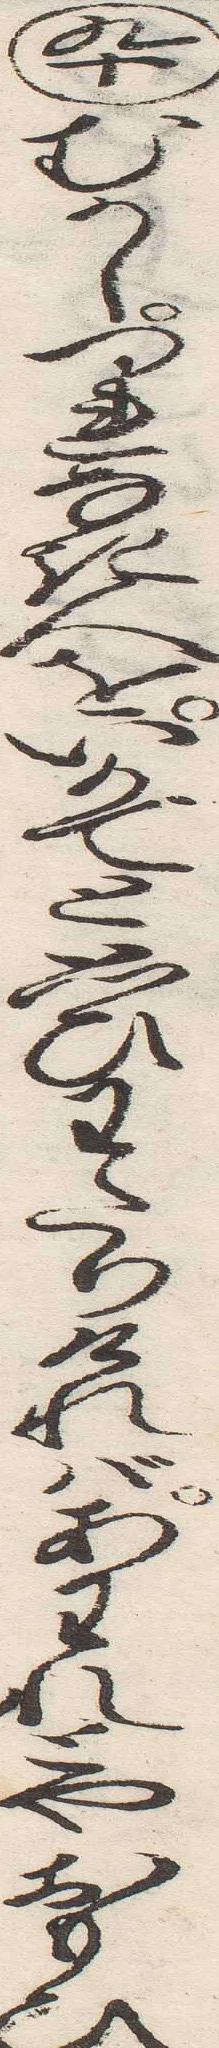九十むかし。つれなき人を。いかでと思ひわたりければ。あわれとやおもひ
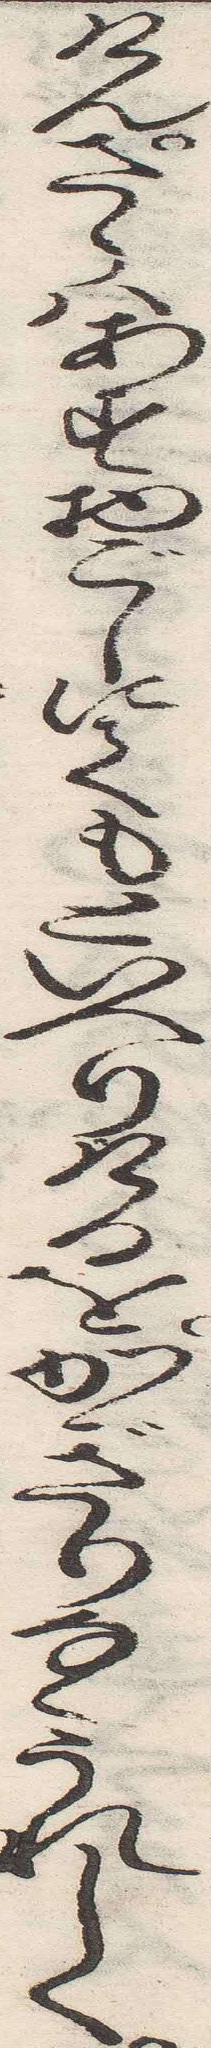けん。さらはあす物ごしにてもといへりけるを。かぎりなくうれしく。
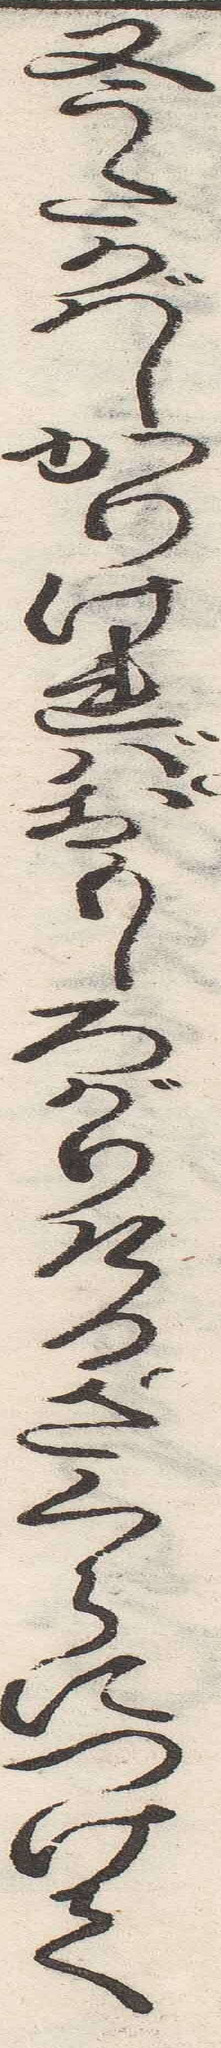又うたがはしかりければ。おもしろがりける。さくらにつけて
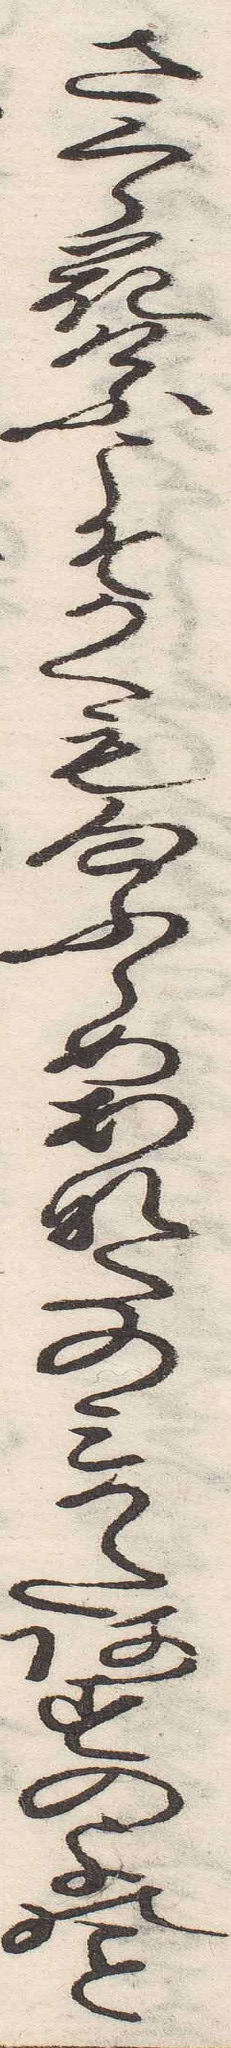さくら花けふこそかくも匂ふらめあなたのみかたあすのよのこと
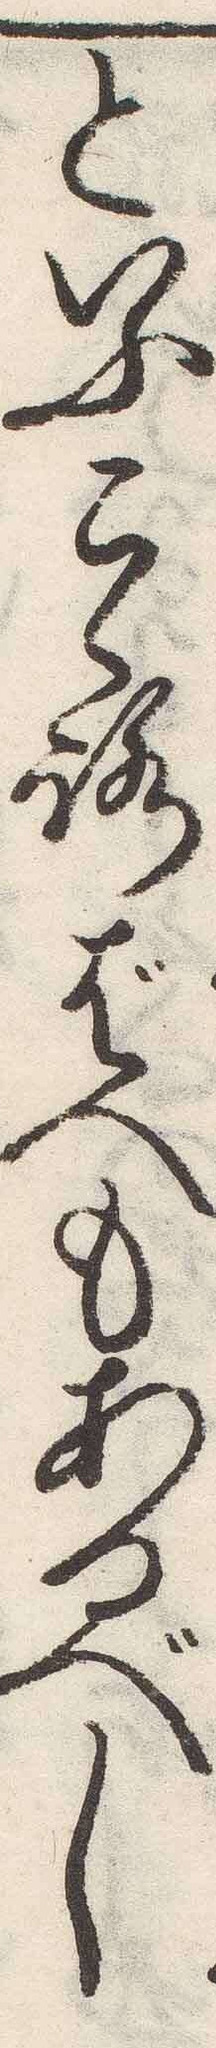といふこゝろばへもあるべし
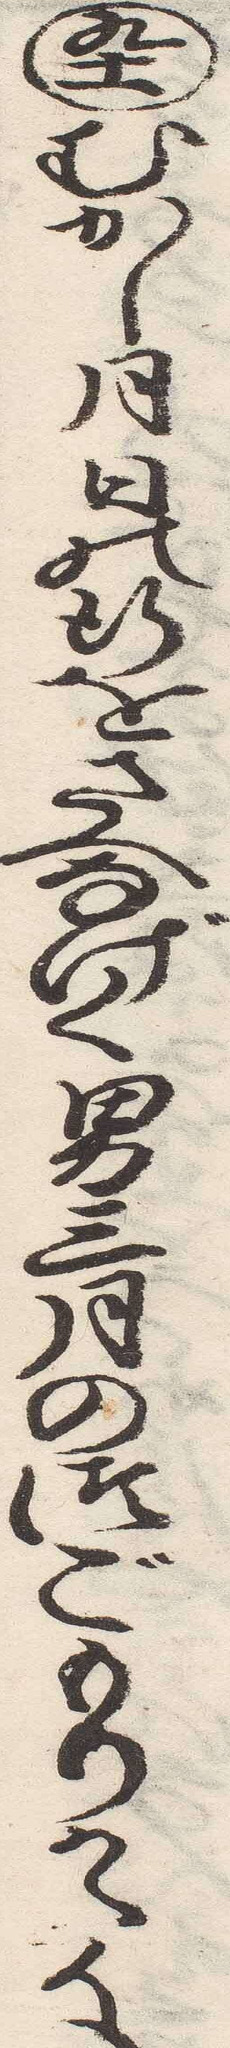九十一むかし月日の行をさへなげく男三月のつごもりかたに
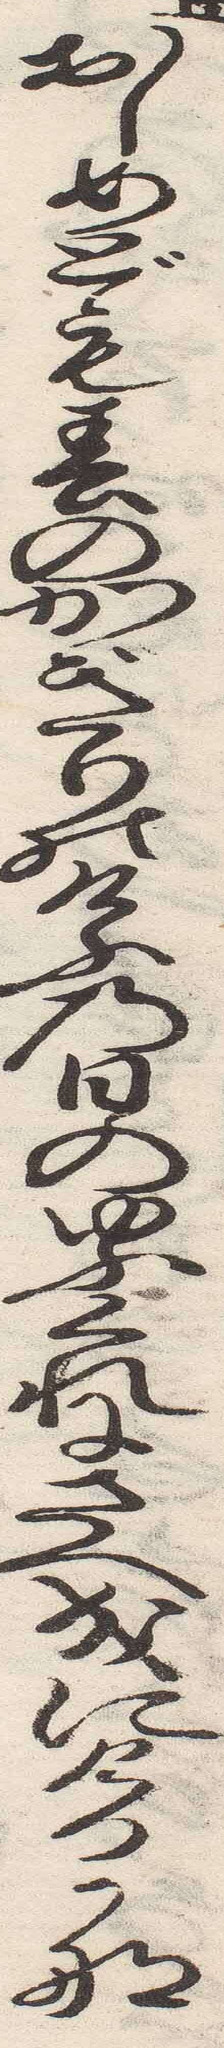後撰おしめども春のかぎりのけふの日のゆふくれにさへ成にけるかな
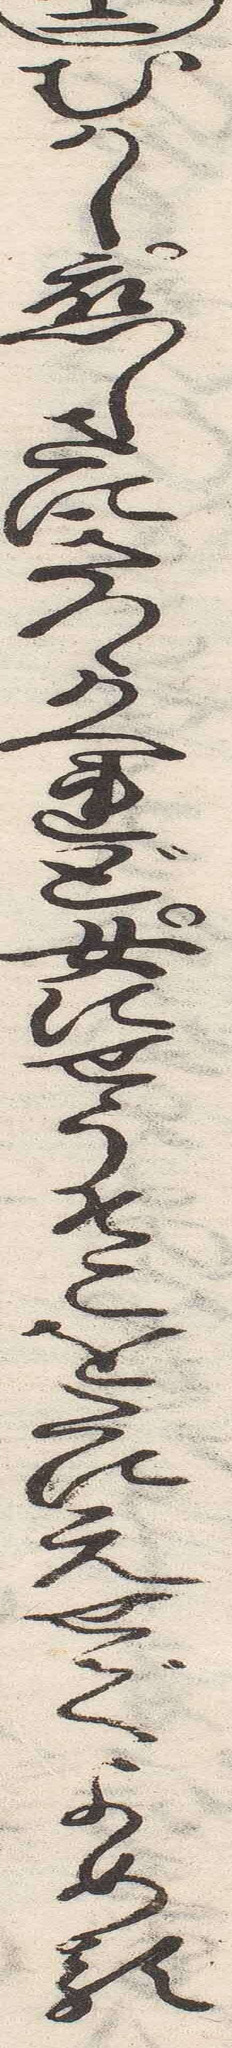九十二むかし。恋しさにきつゝかへれど。女にせうそこをたにえせでよめる
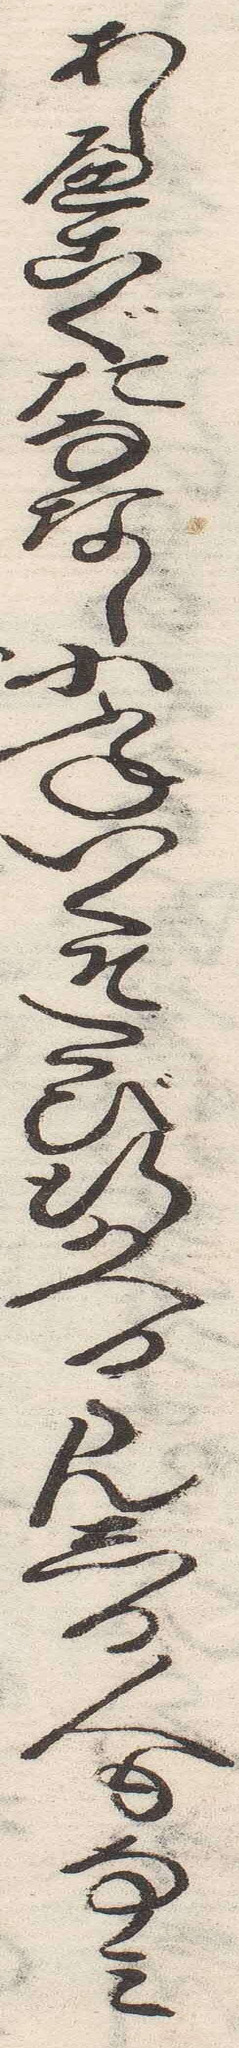あしへこぐたななし小ふねいくそたび行かへるらんしる人もなみ
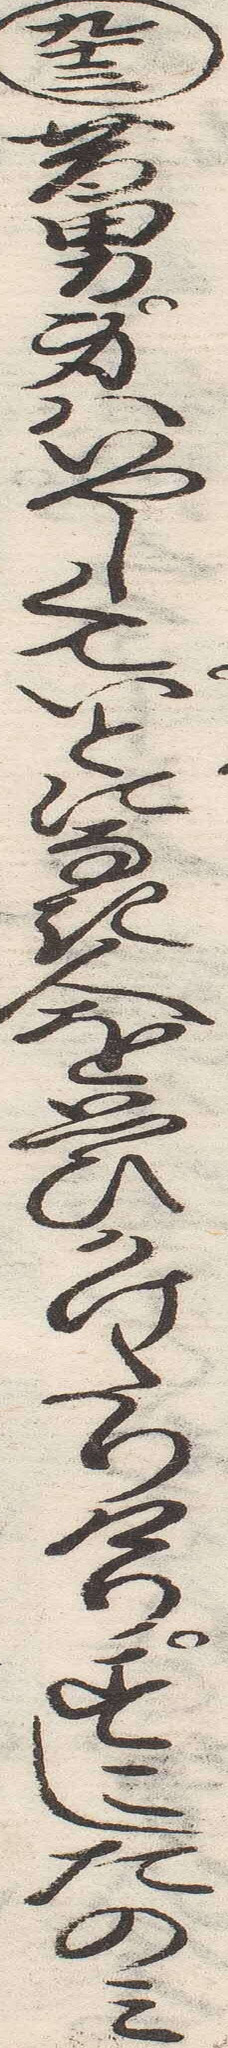九十三昔男。身はいやしくて。いとになき人を思ひかけたりけり。すこしたのみ
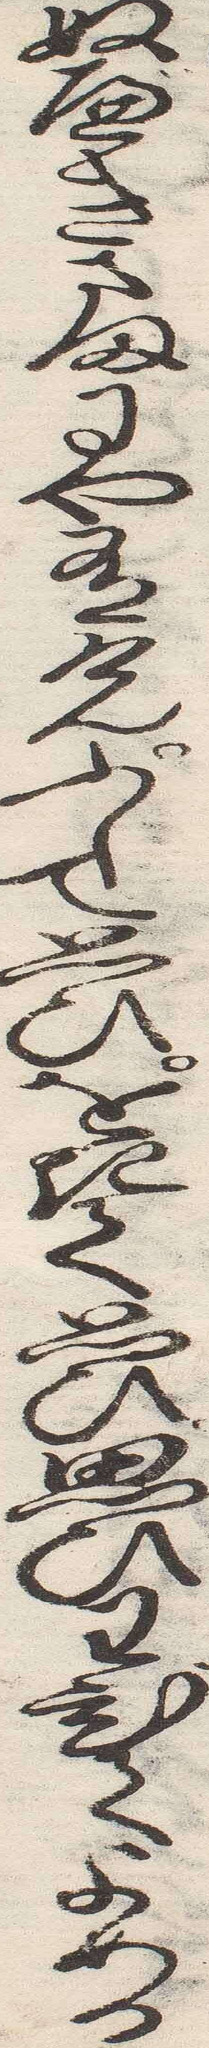ぬべきさまにや有けん。ふして思ひ。をきて思ひ。おもひわびてよめる
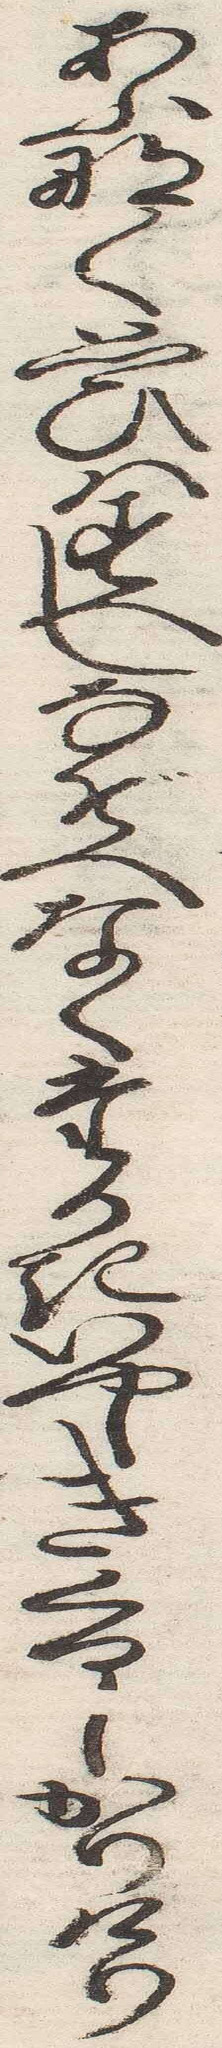あふな〳〵思ひはすへしなぞへなくたかきいやしきくるしかりけり
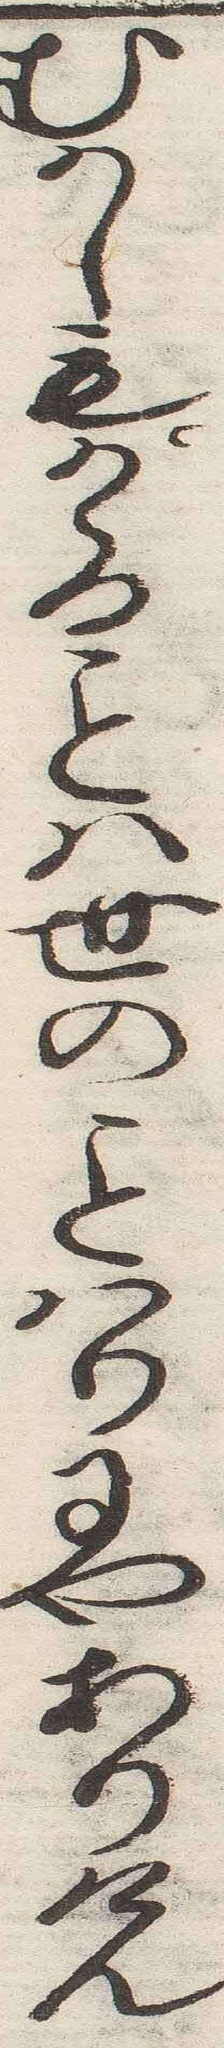むかしも。かゝることは世のことはりにやありけん
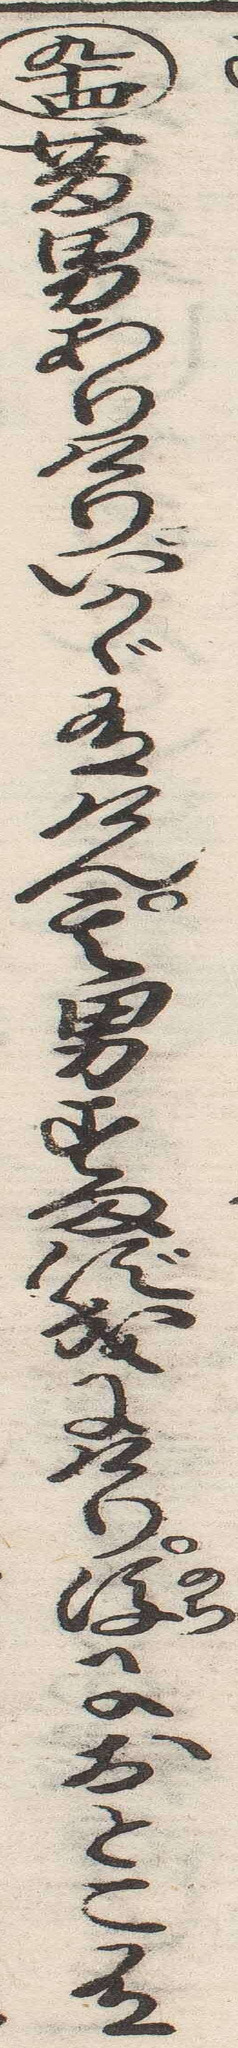九十四昔男ありけり。いかゞ有けん。其男すまず成にけり。後におとこ有
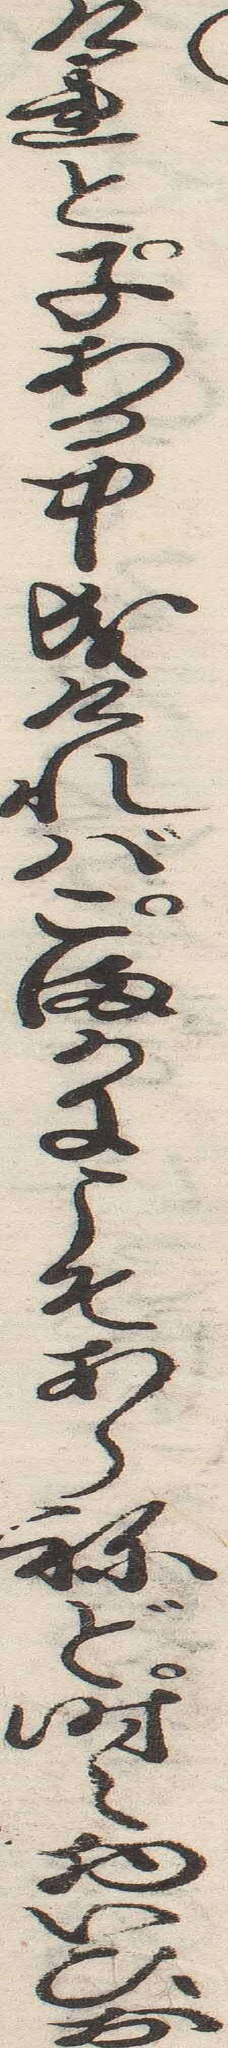けれと。子ある中成ければ。こまかにこそあらねど。時々物いひお
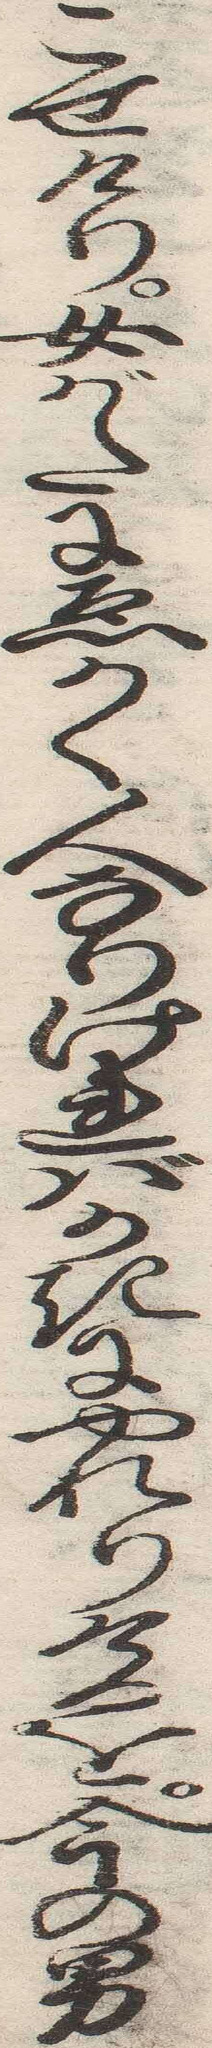こせけり。女がたにゑかく人なりければかきにやれりけるを。今の男
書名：伊勢物語
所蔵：東京学芸大学附属図書館 国文学研究資料館
